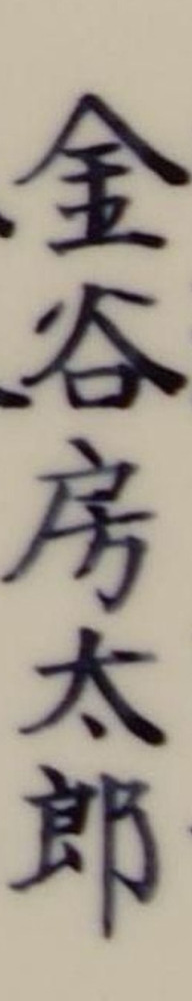金谷房太郎
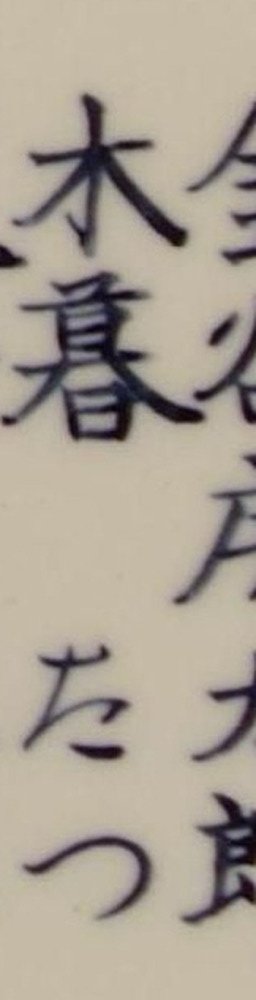木暮たつ
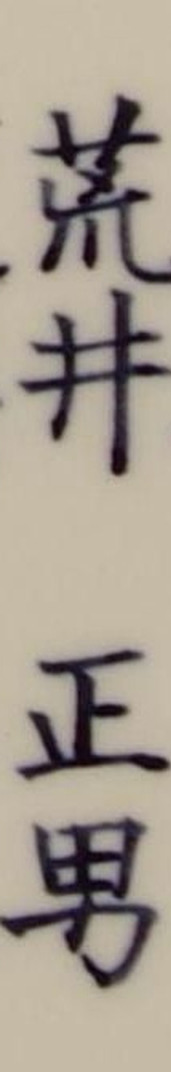荒井正男
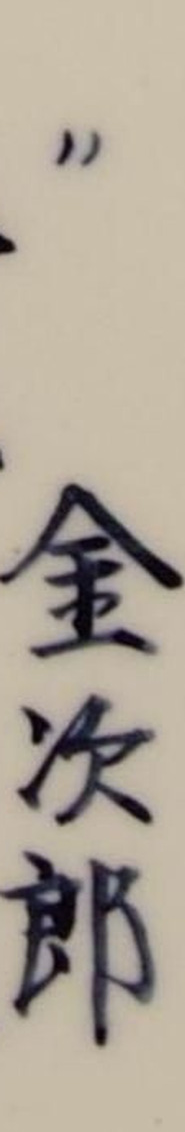金次郎
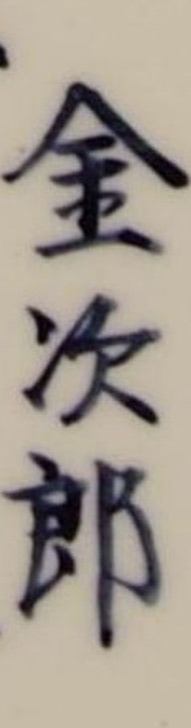金次郎
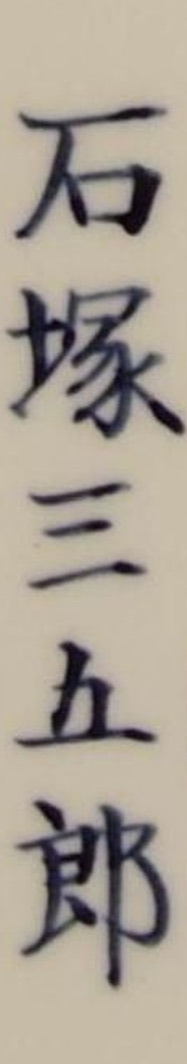石塚三五郎
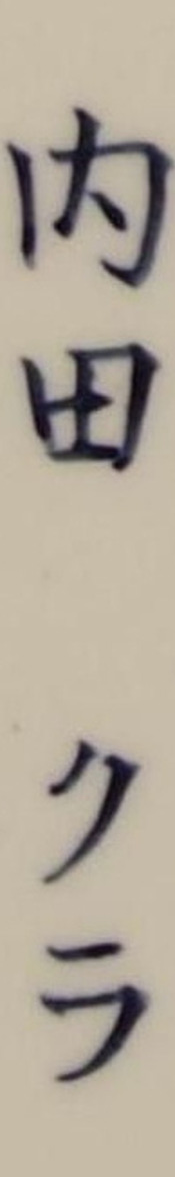内田クラ
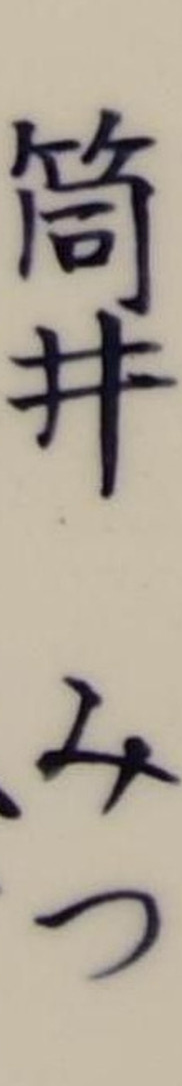筒井みつ
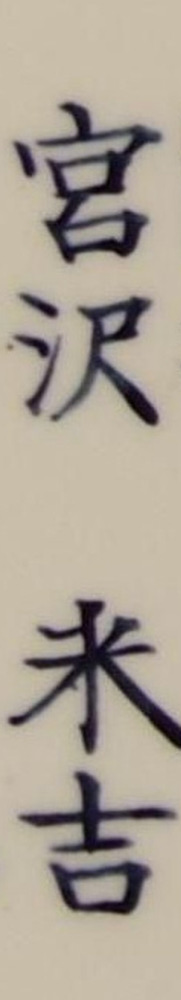宮沢米吉
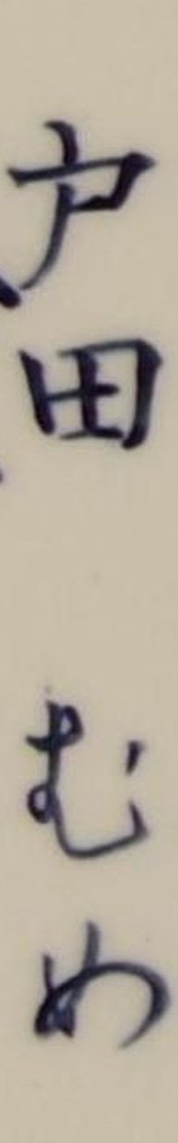戸田むめ
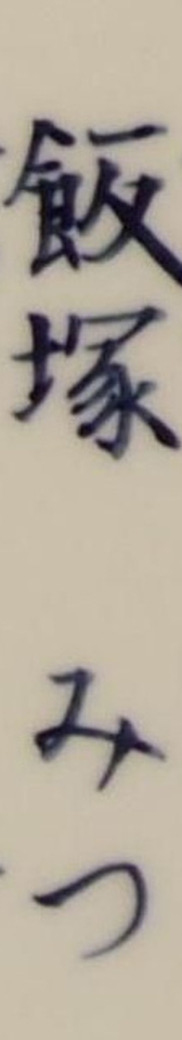飯塚みつ
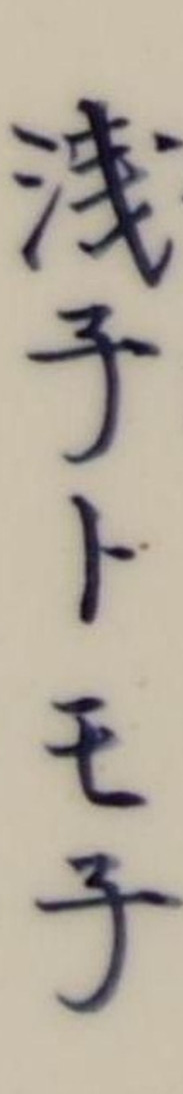浅子トモ子

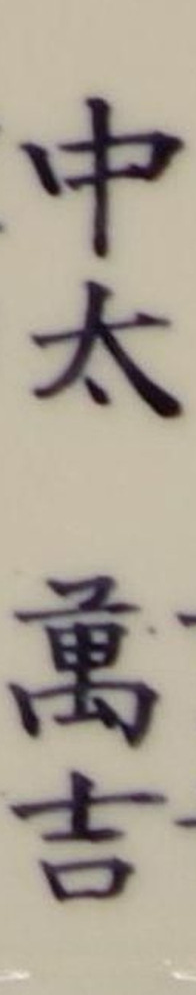中太萬吉
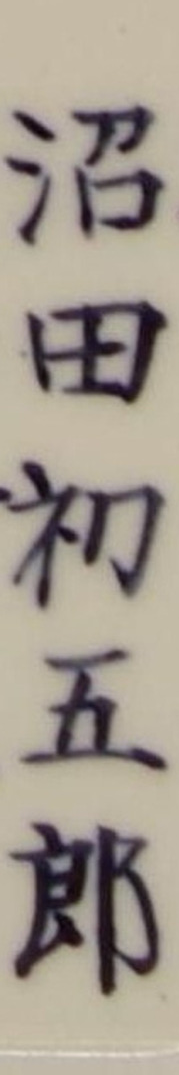沼田初五郎
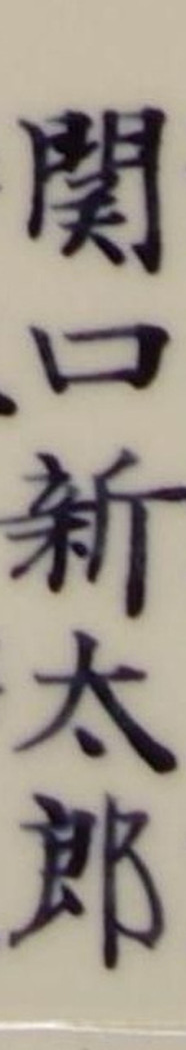関口新太郎
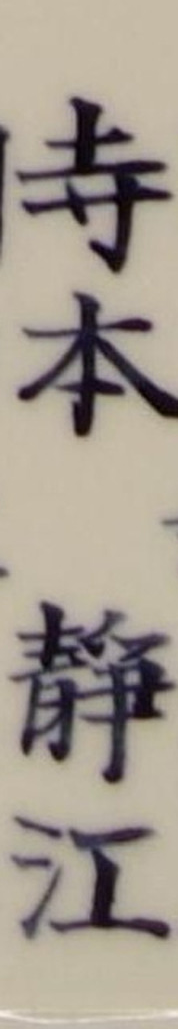寺本静江
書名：E~L
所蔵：高野山金剛峯寺
